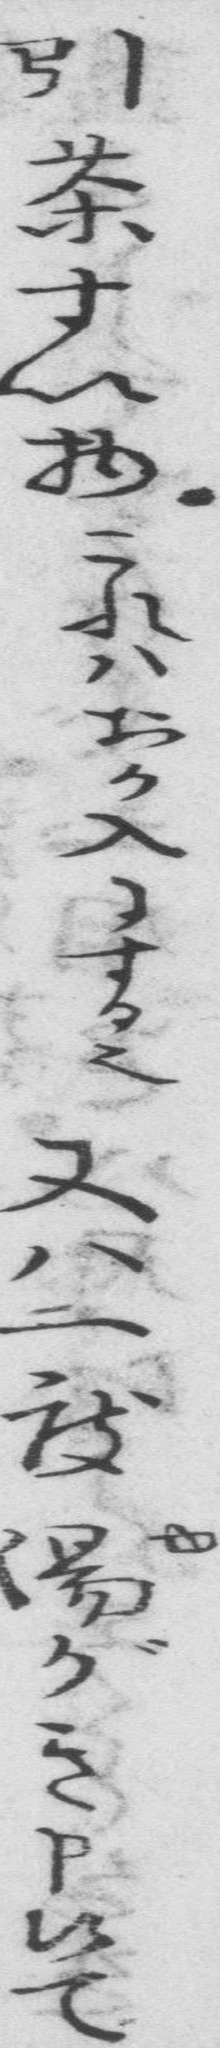引茶すい物。これはおか入にする也又は一度湯がき申候て
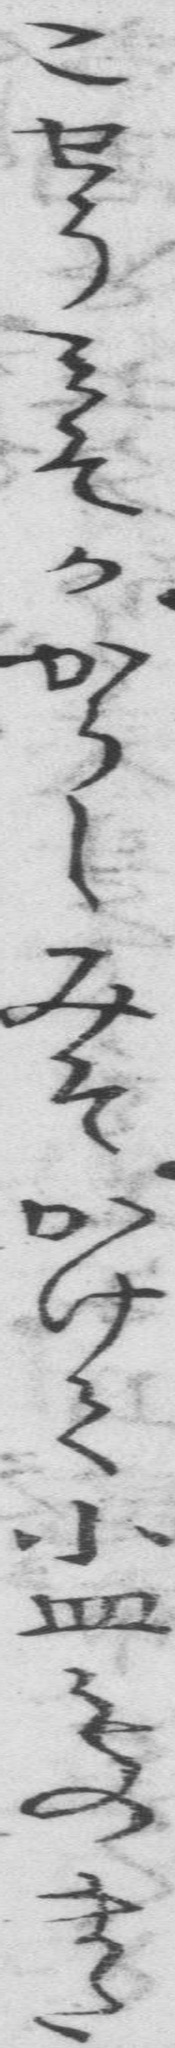こせうみそか。からしみそ。かけて小皿もの。また
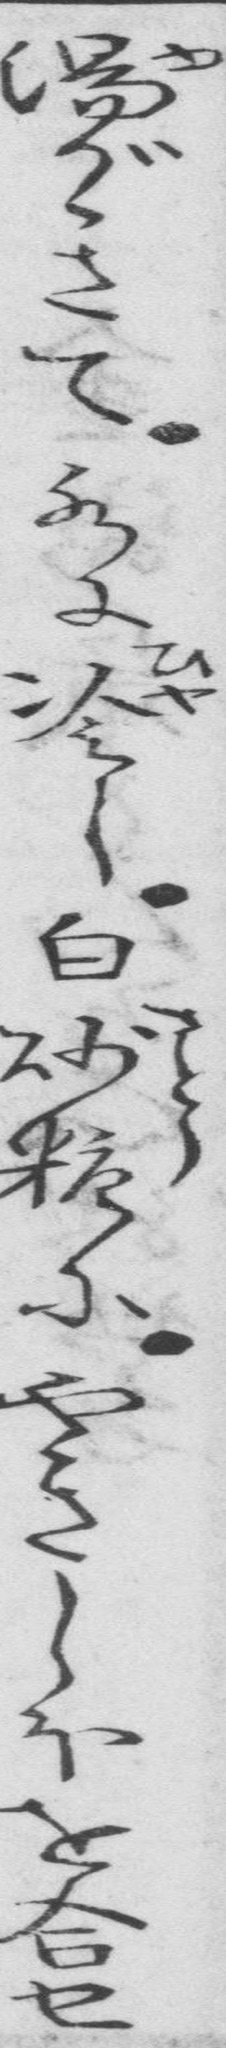湯がきて。水に冷し。白砂糖に。やきしほを合せ
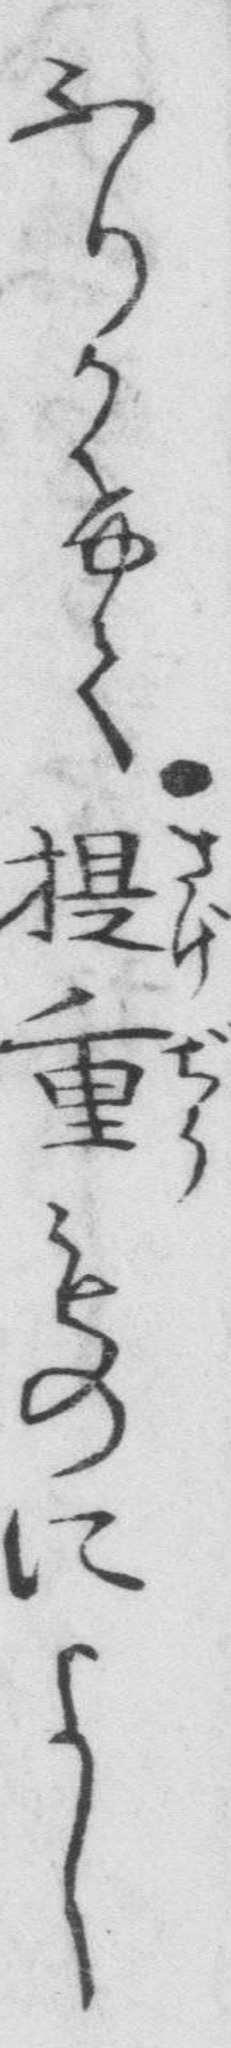ふりかけて。提重ものによし
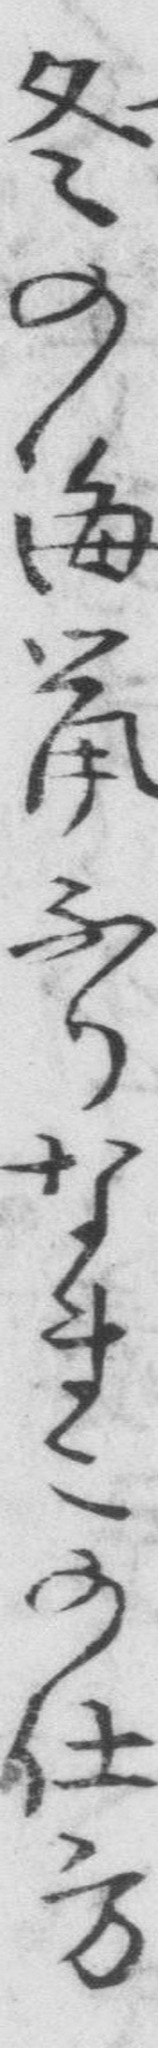冬の海鼠ふりなまこの仕方
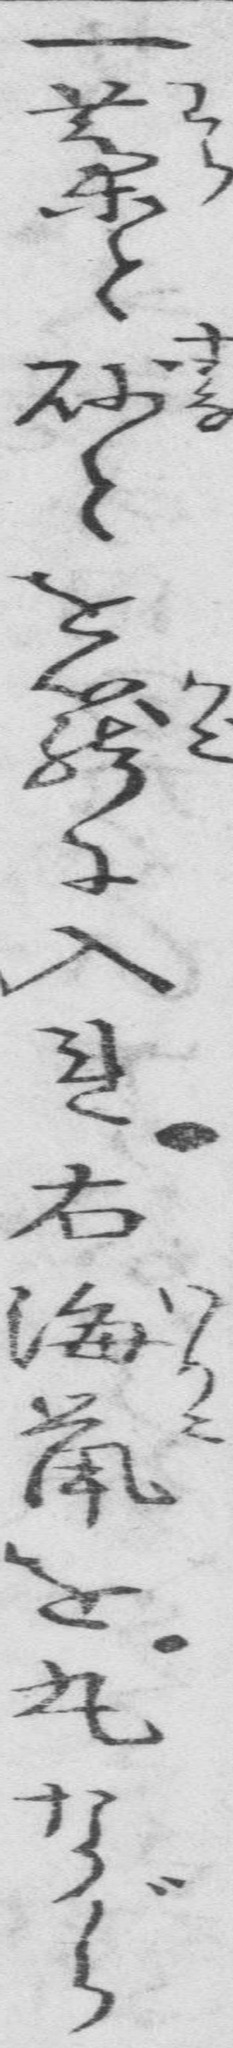一藁を砂と籠に入れ。右海鼠を。丸ながら
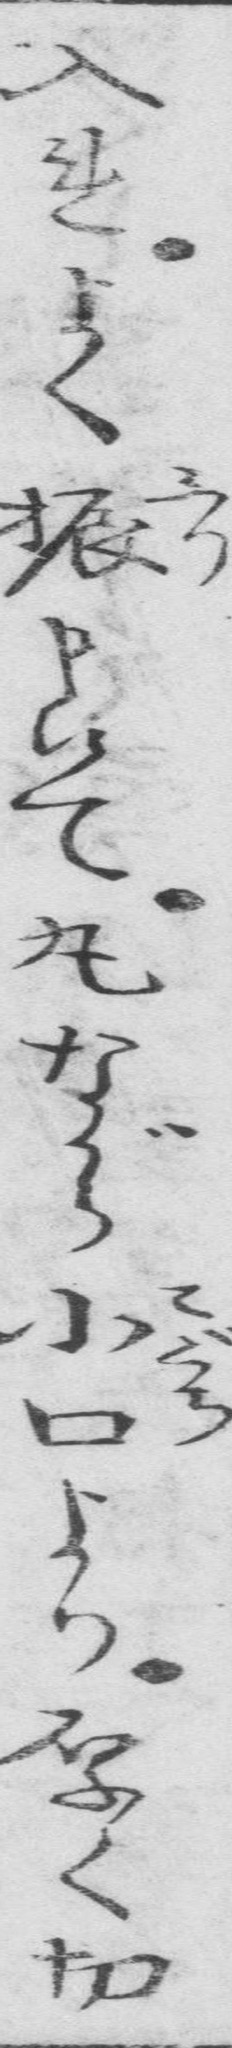入れ。よく振申候て。丸ながら小口より。厚く切
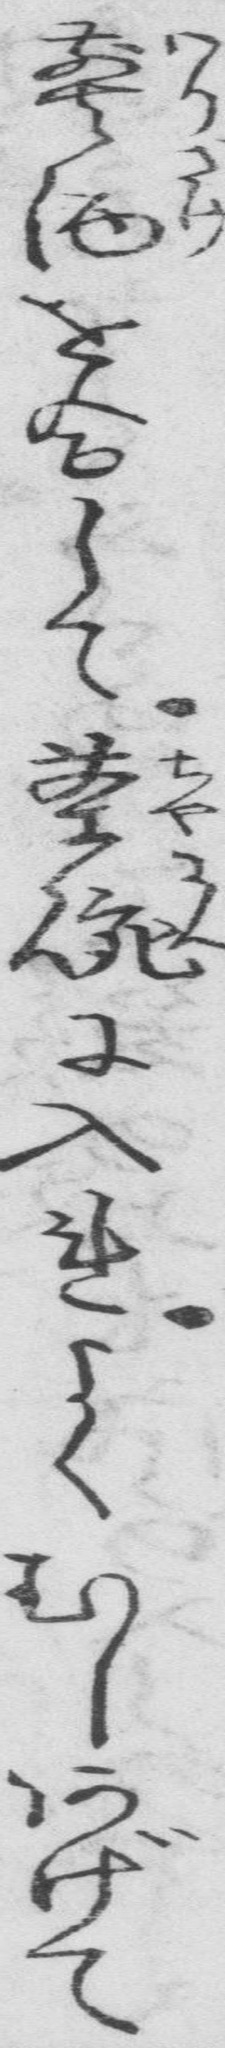煎酒を合して。茶碗に入れ。よくむしあげて
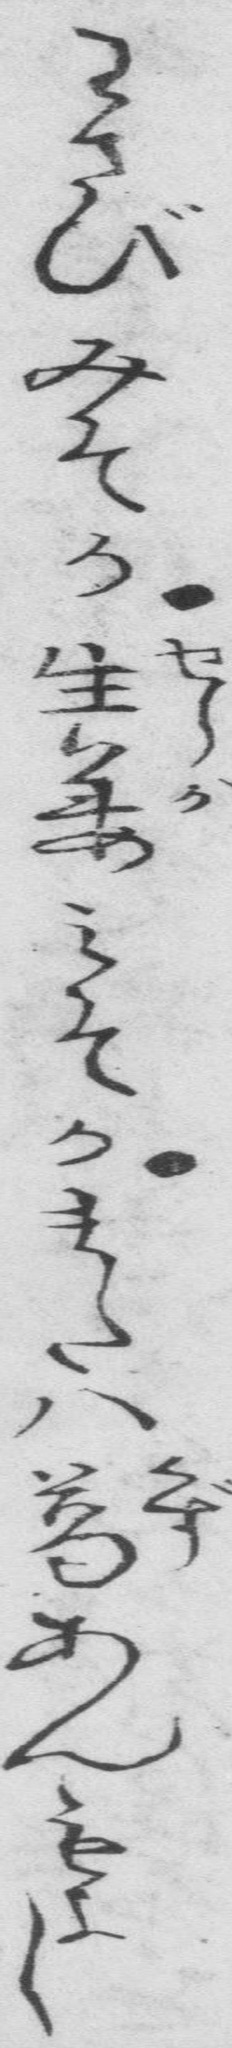わさびみそか。生姜みそか。または葛あんもよし
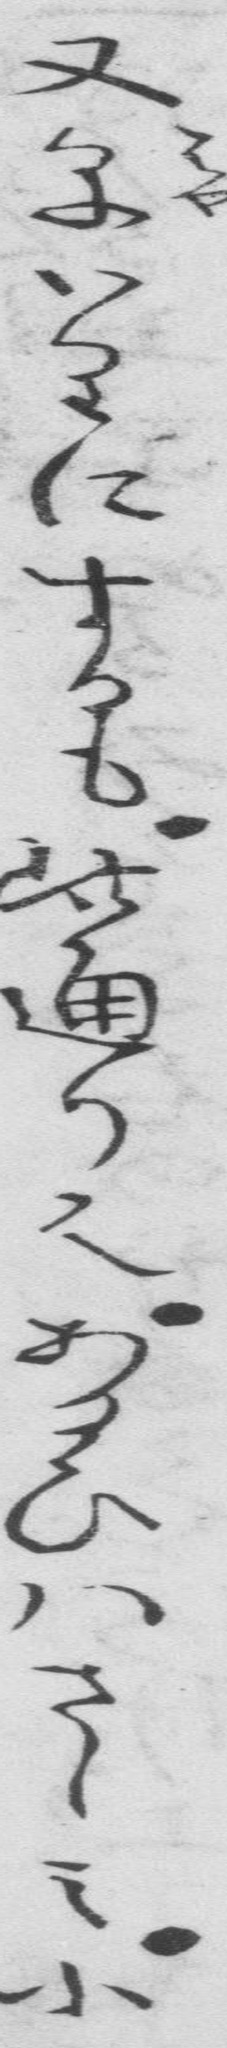又早いりにするも。此通り也。あるひはさしみ。小
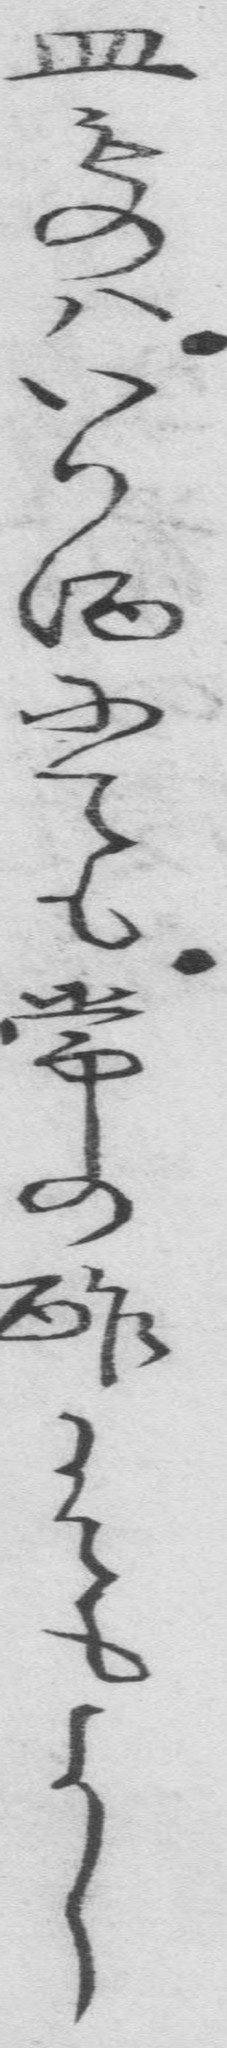皿ものは。いり酒にても。常の酢にてもよし

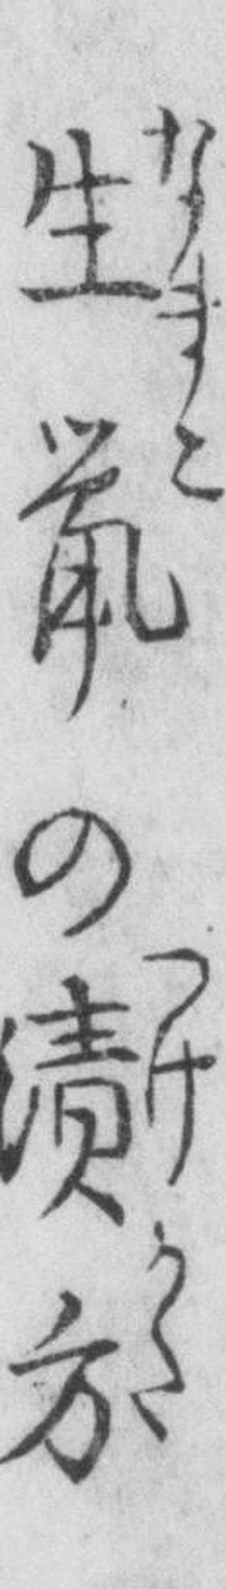生鼠の漬方
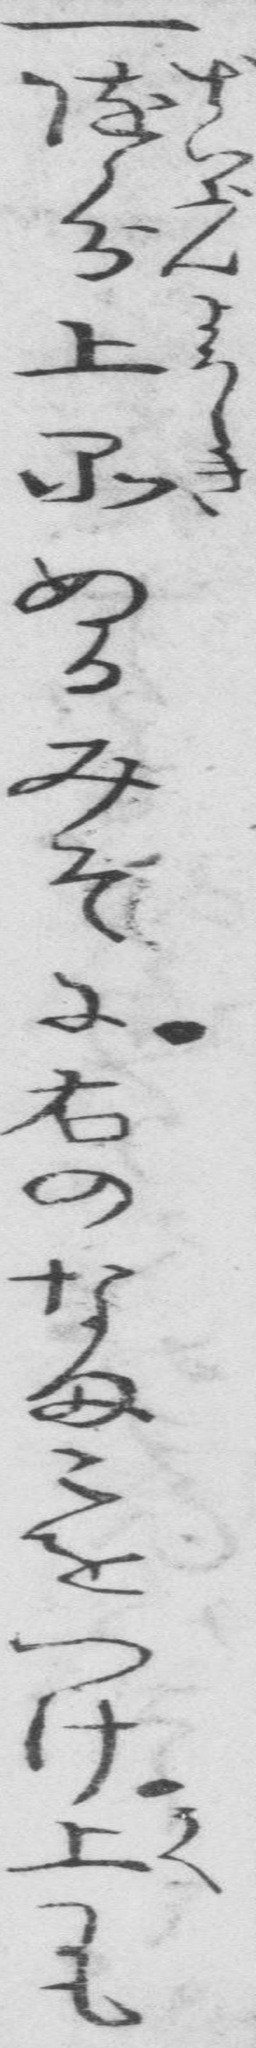一随分上品ぬかみそに。右のなまこをつけ。上にも
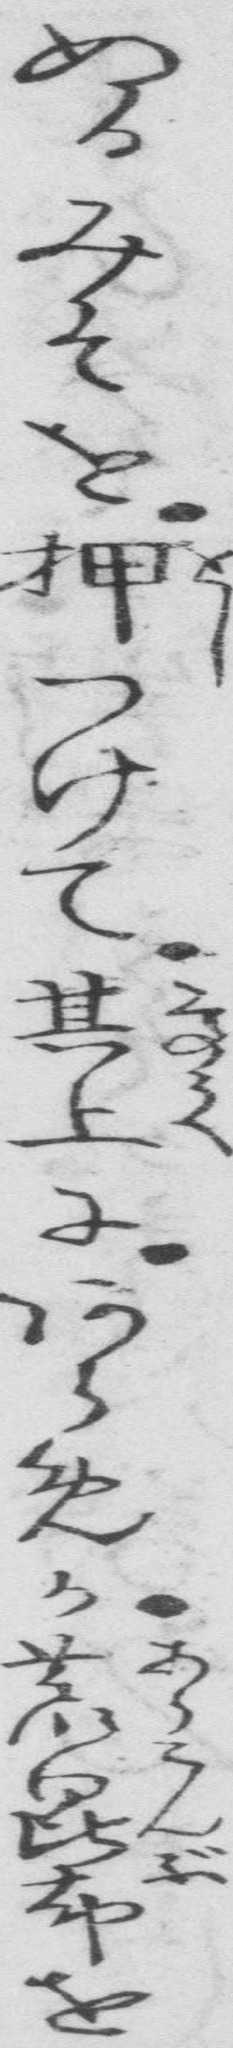ぬかみそを。押つけて。其上に。あらめか。荒昆布を
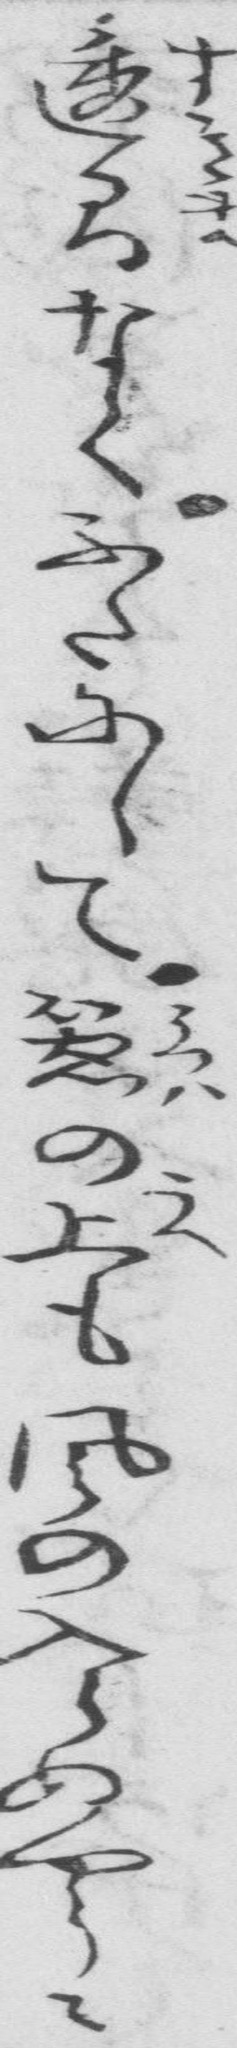透間なく。ふたにして。器の上も風の入らぬやうに
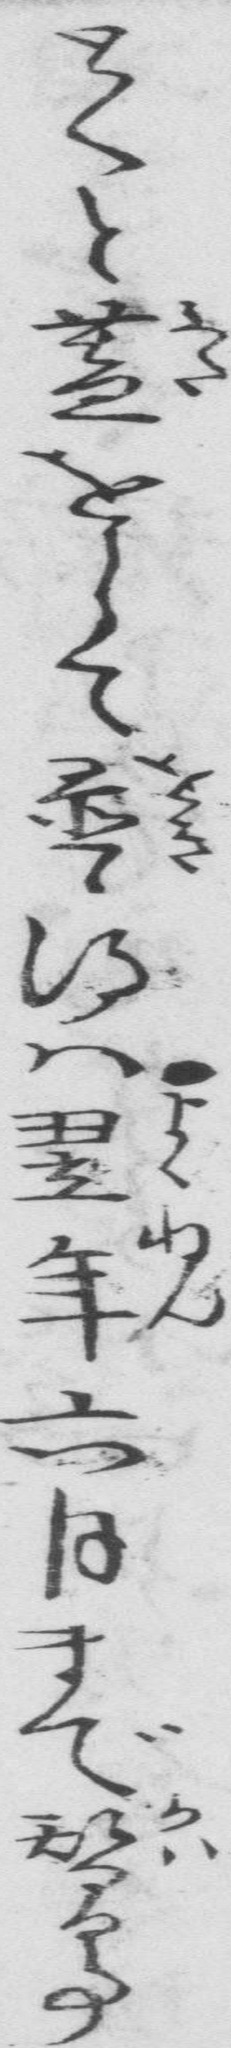とくと蓋をして置候得は。翌年六月まで替る事
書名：萬寳料理秘密箱
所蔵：大阪府立大学学術情報センター 国文学研究資料館
